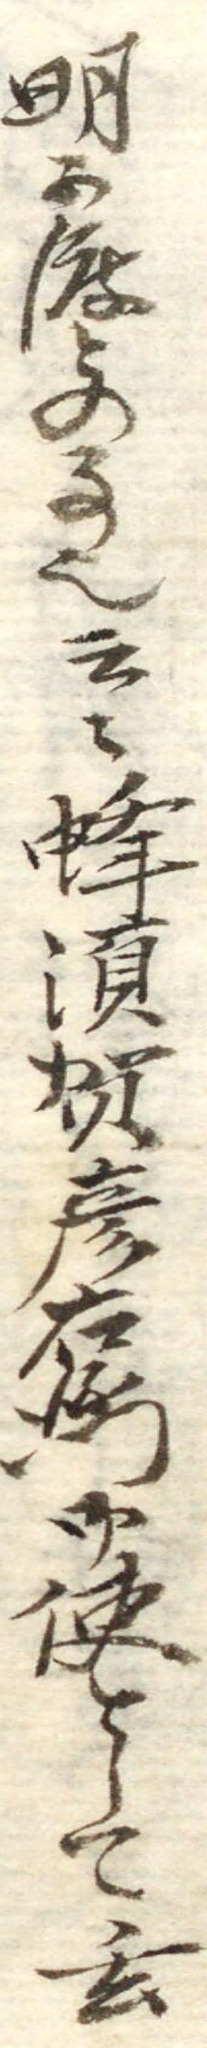明可渡との事也云々蜂須賀彦右衛門御使として玄
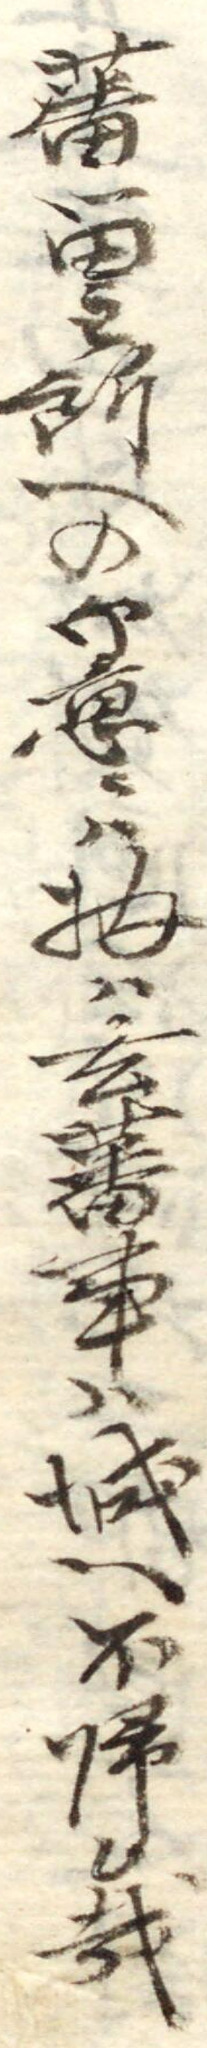蕃留主所への御意には扨は玄蕃事は城へ不帰候哉
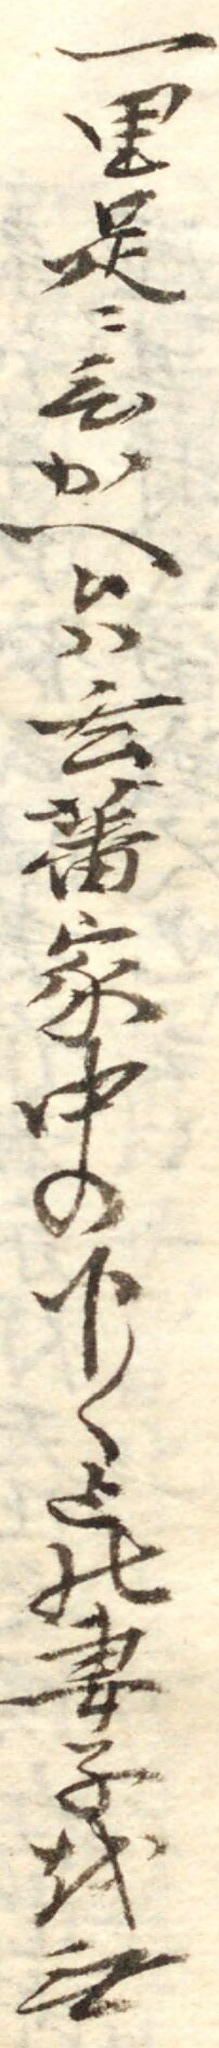一里足にひかへ候は玄蕃家中の下々迄能妻子越無
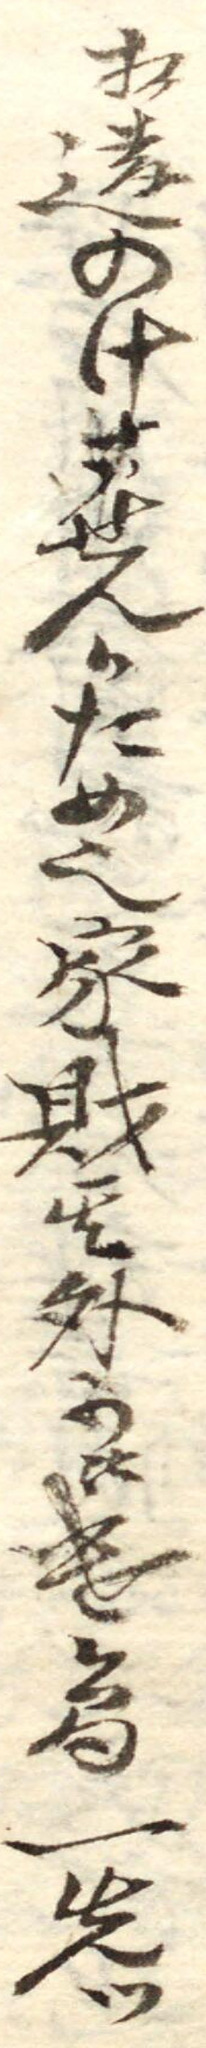相違のけさせんかため也家財其外可被遣候間一先つ
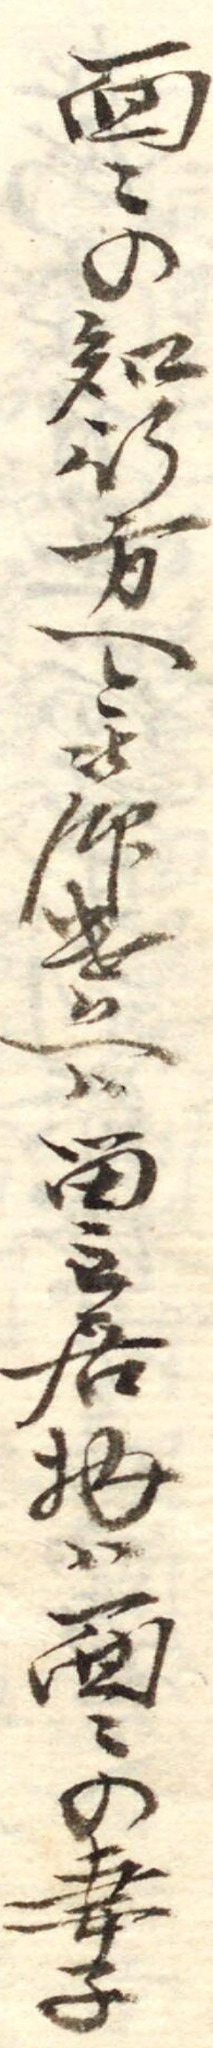面々の知行方へと被仰遣候へは留主居扨は面々の妻子
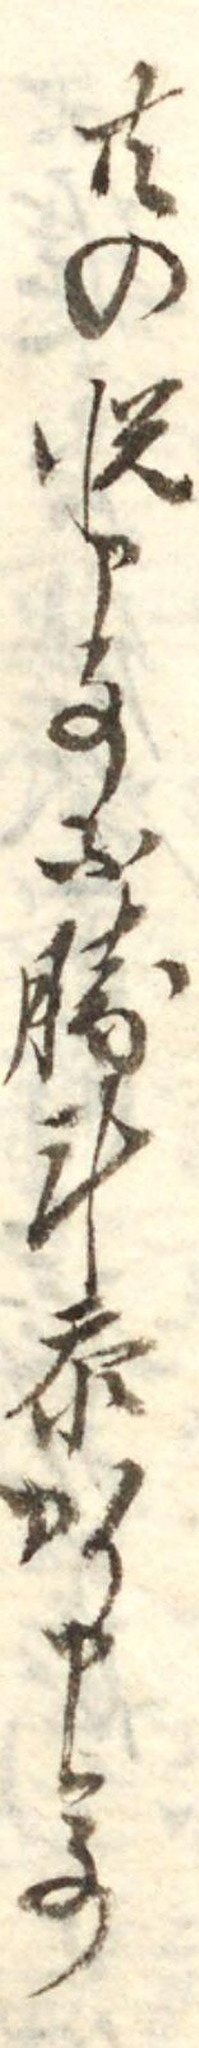共の悦申事不勝斗忝かり申候事
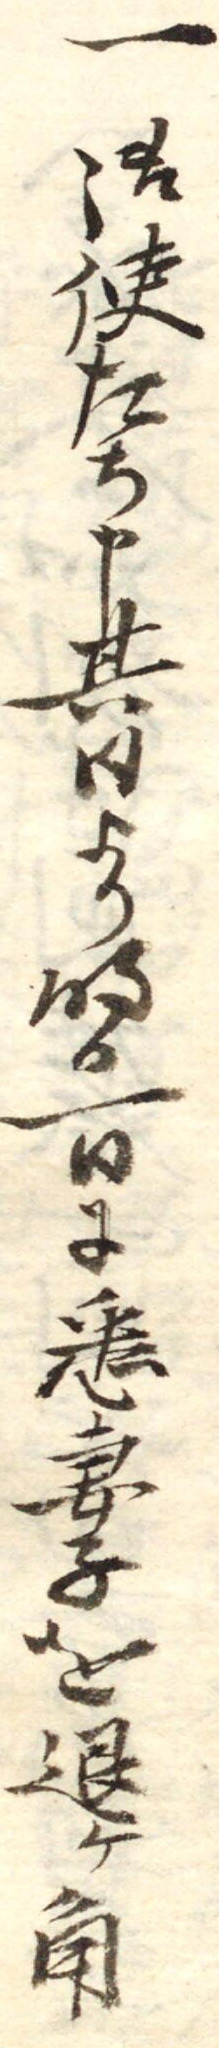一御使たち申其日より明日一日尓悉妻子を退け角
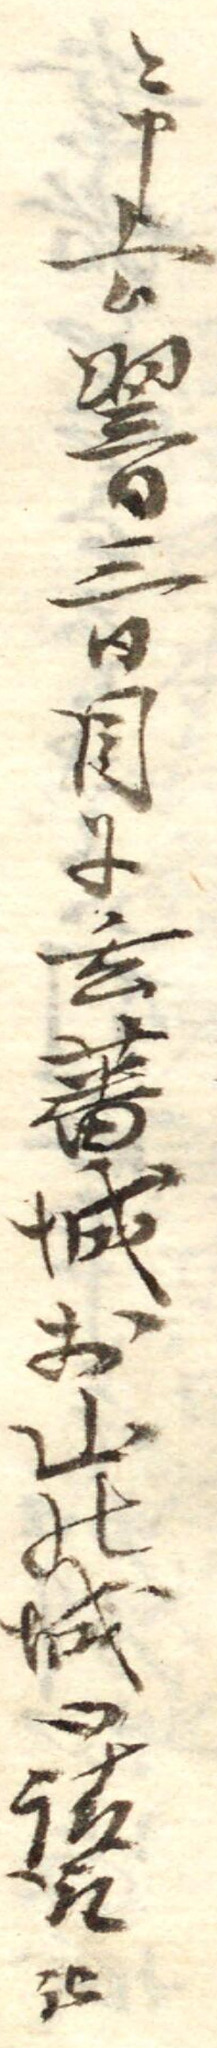と申上候翌日三日目尓玄蕃城お山能城御請取被
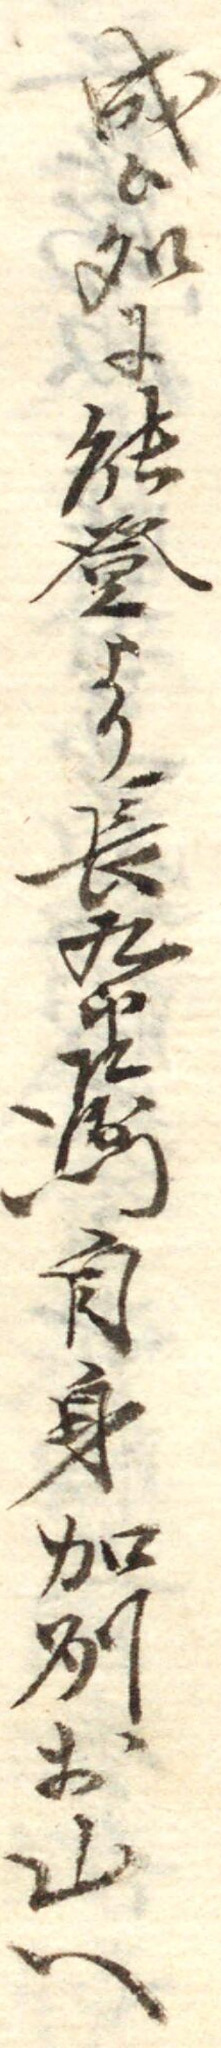成候処尓能登より長九郎左衛門自身加州お山へ
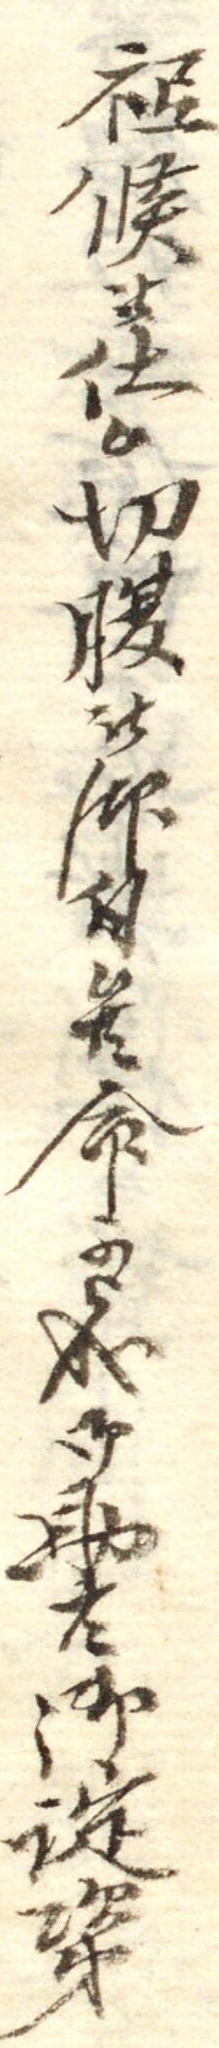祠候被仕候切腹被仰付候共命可被成御助共御諚次第
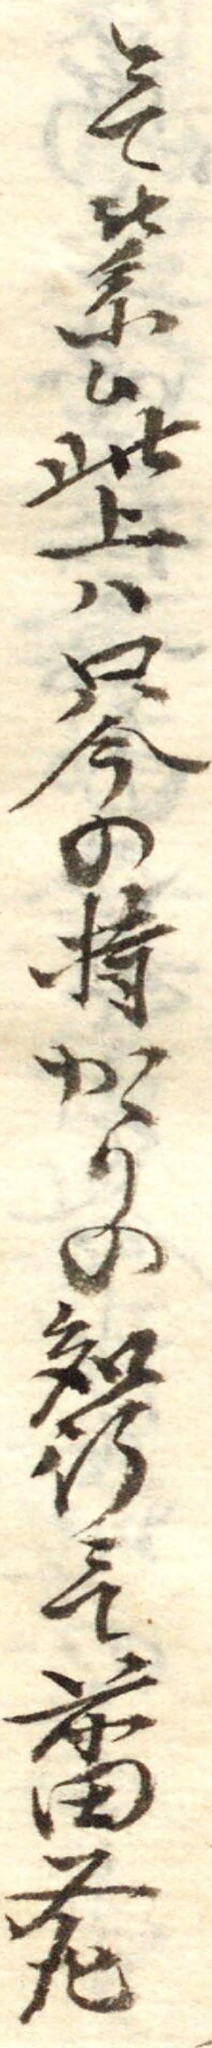とて被参候此上は只今の持かゝりの知行にて前田又左

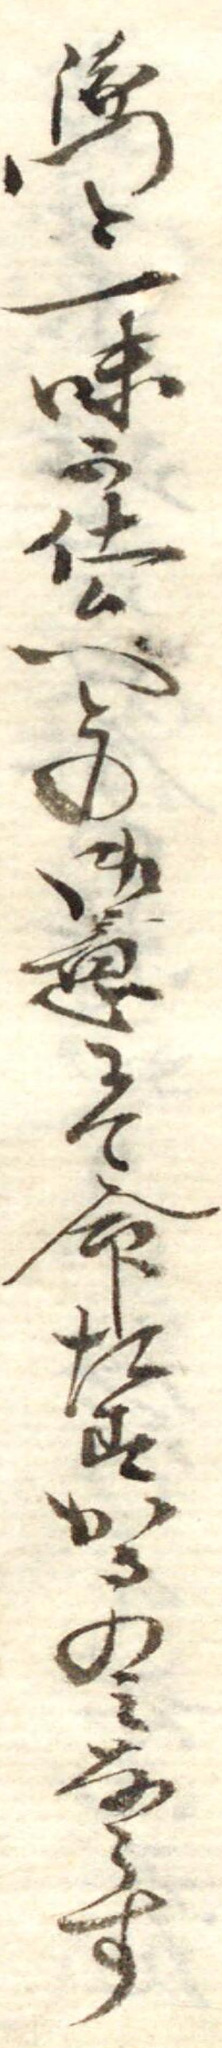衛門と一味可仕候へとの御意にて命た春かるのみならす
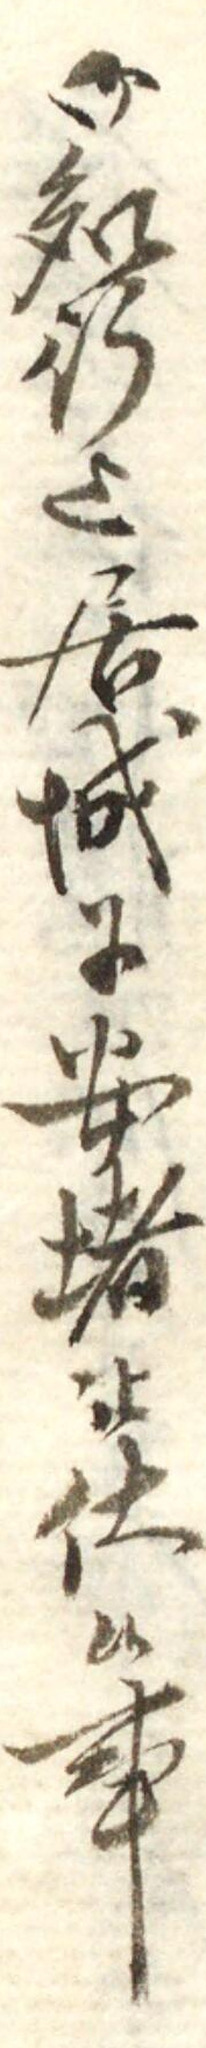御知行迄居城尓安堵被仕候事
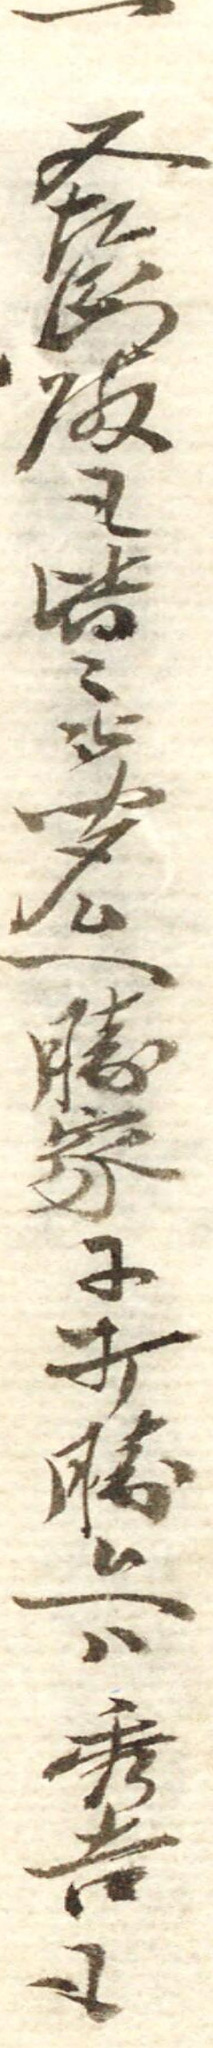一又左衛門殿も皆々被聞候へ勝家尓打勝候へは秀吉も
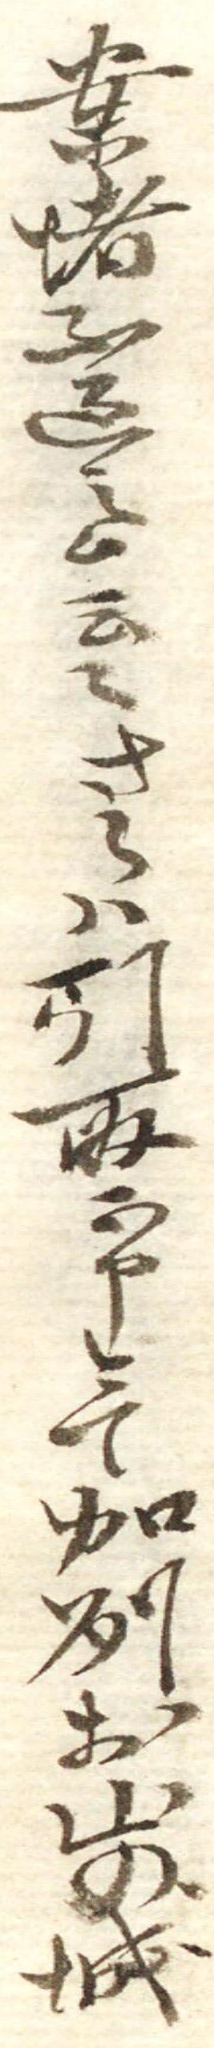安堵ふ過之候云々さらは引取可申とて加州お山の城
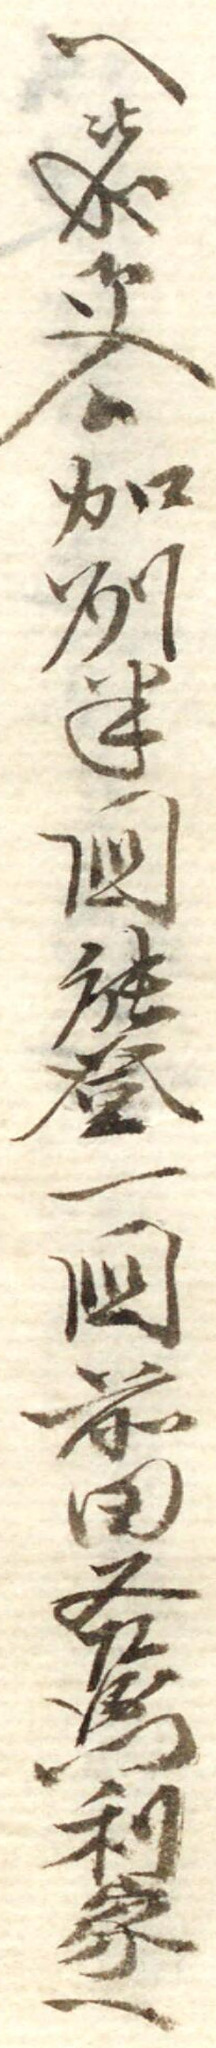へ被成御入候加州半国能登一国前田又左衛門利家へ
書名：前田家封国証書集録
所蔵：Ishikawa Prefectural Library
